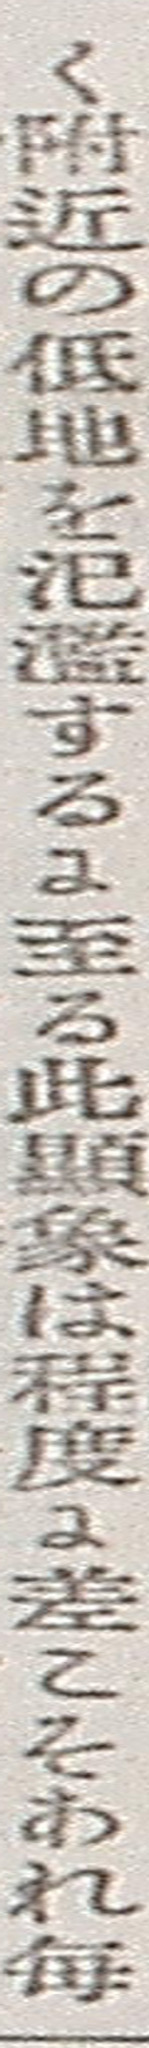く付近の低地を氾濫するに至る此顕象は程度に差こそあれ毎
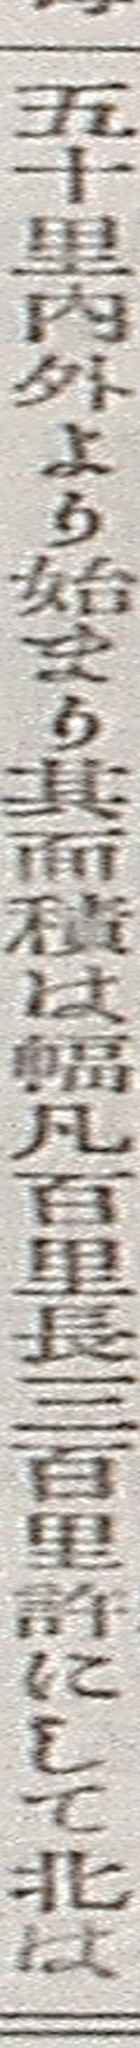五十里内外より始まり其面積は幅凡百里長三百里許にして北は
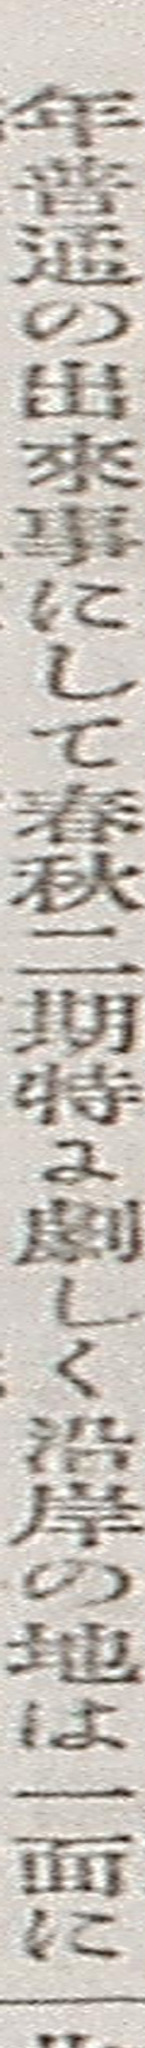年普通の出来事にして春秋二期特に劇しく沿岸の地は一面に
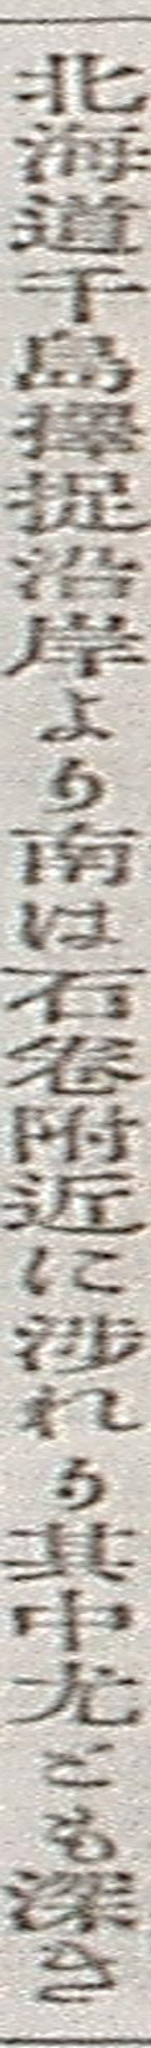北海道千島樺捉沿岸より南は石巻付近に渉れり其中尤とも深き
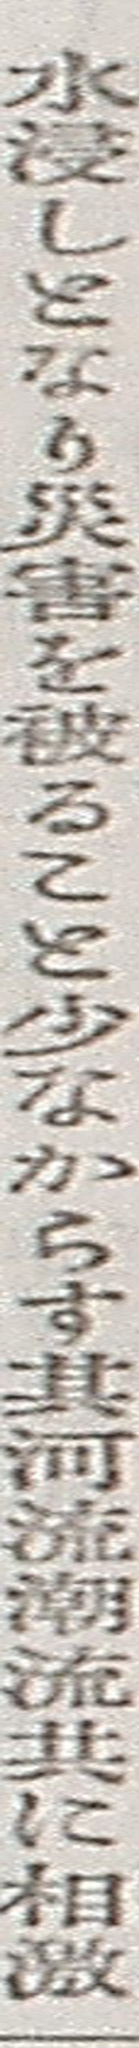水浸しとなり災害を被ること少なからす其河流潮流共に相激
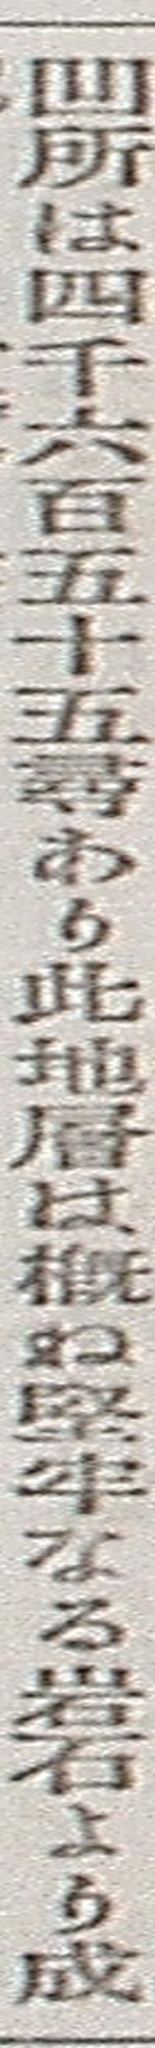凹所は四千六百五十五尋あり此地層は概ね堅牢なる岩石より成
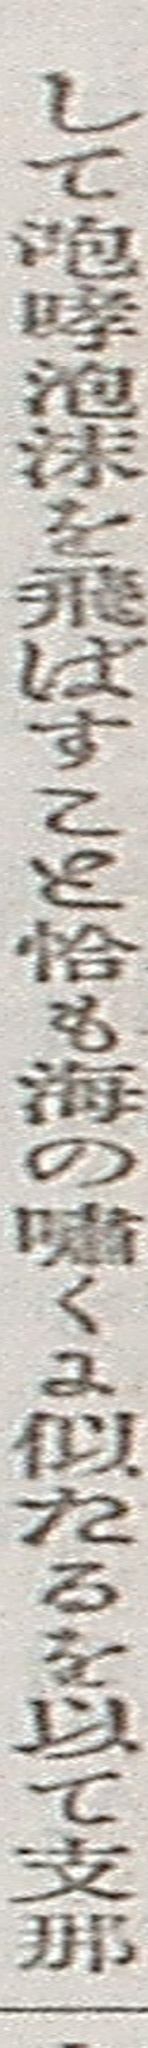して咆哮泡沫を飛ばすこと恰も海の嘯くに似たるを以て支那
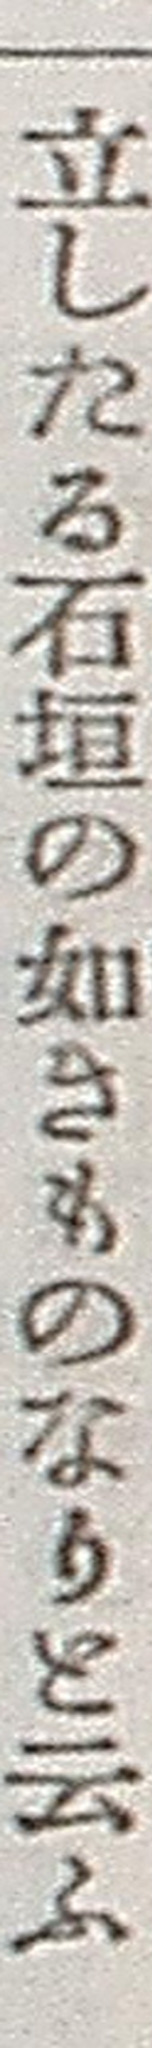立したる石垣の如きものなりと云ふ

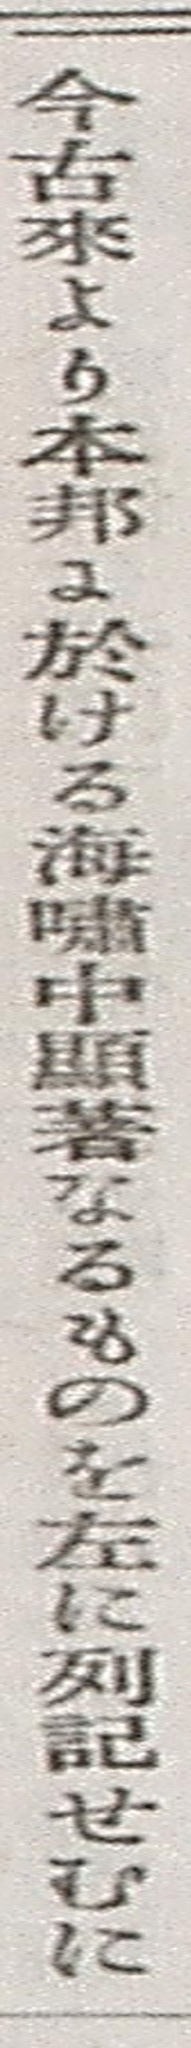今古来より本邦に於ける海嘯中顕著なるものを左に列記せむに
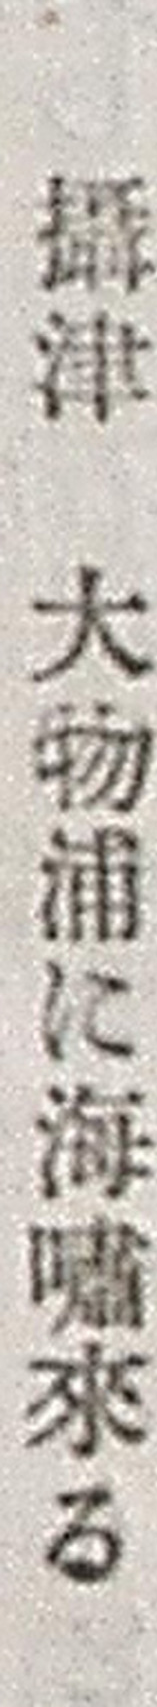摂津大物浦に海嘯来る
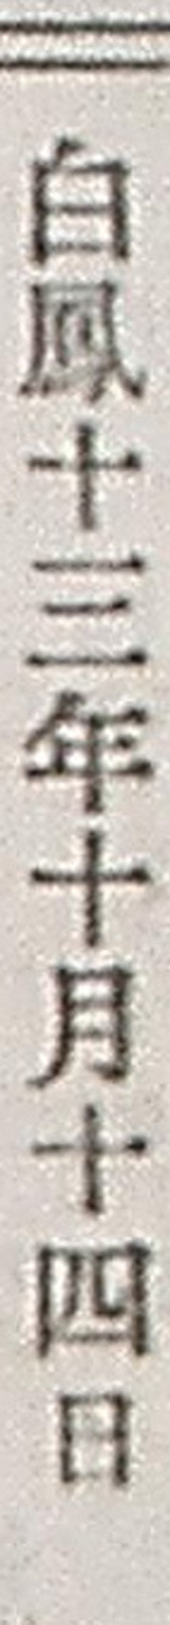白鳳十三年十月十四日
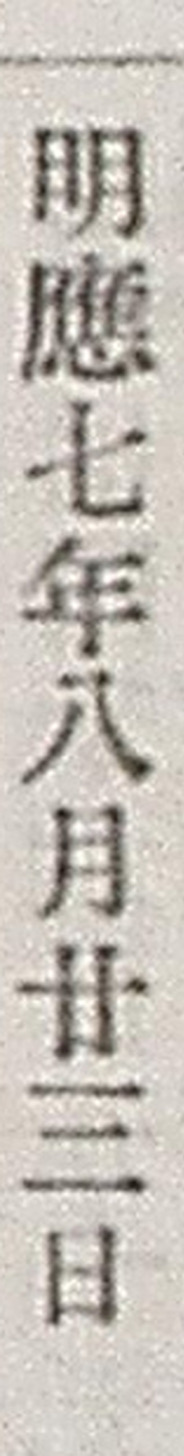明応七年八月廿三日
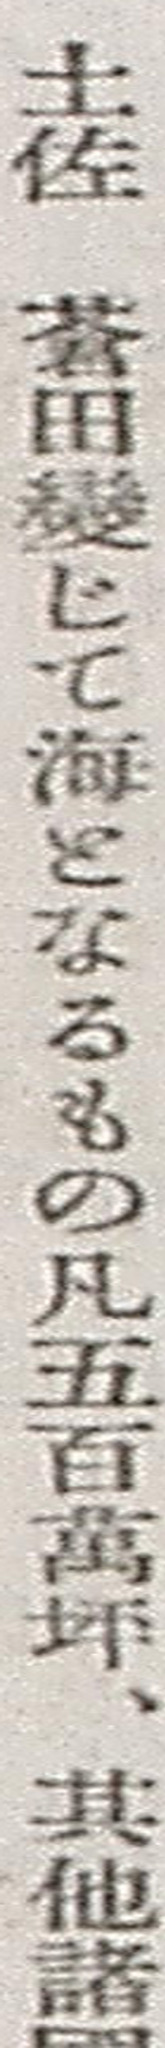土佐蒼田変じて海となるもの凡五百万坪、其他諸国に海
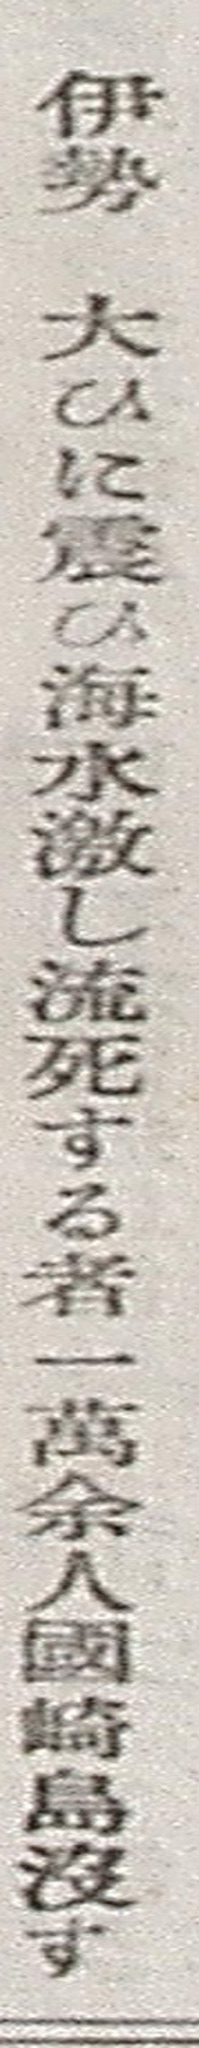伊勢大ひに震ひ海水激し流死する者一万余人国崎島没す
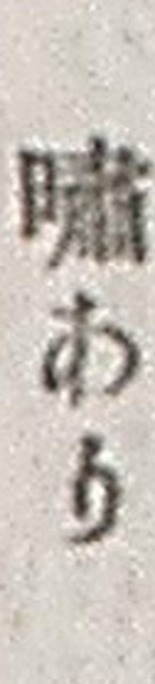嘯あり
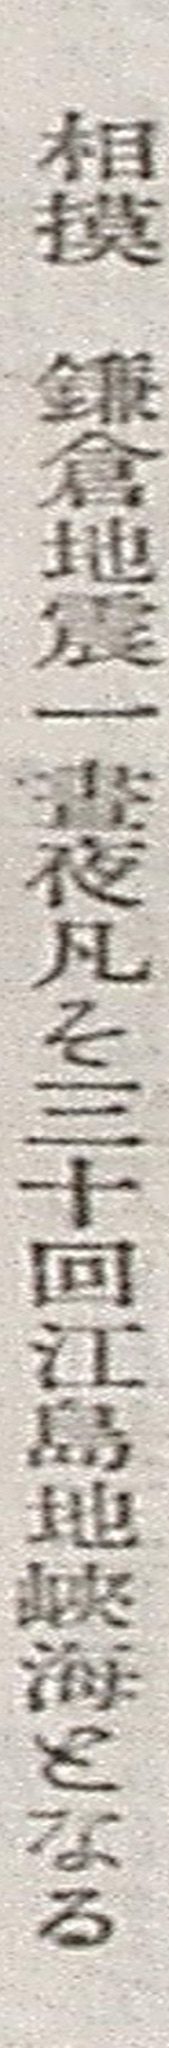相模鎌倉地震一昼夜凡そ三十回江島地峡海となる
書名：風俗畫報臨時増刊第百二十號　大海嘯被害録（下）
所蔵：東京大学地震研究所図書室 Earthquake Research Institute Library, The University of Tokyo, JAPAN
